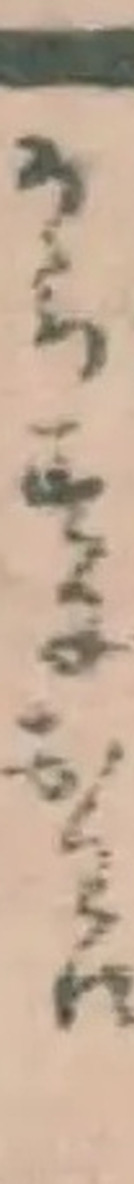からすにおわれ
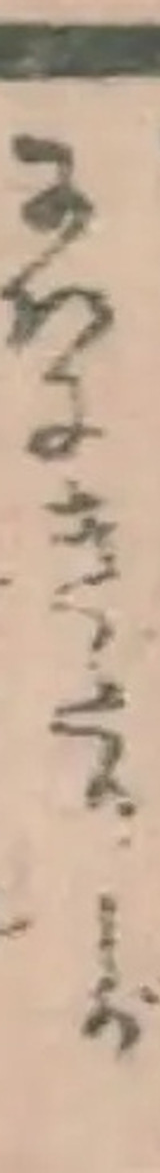にはにきたりしが
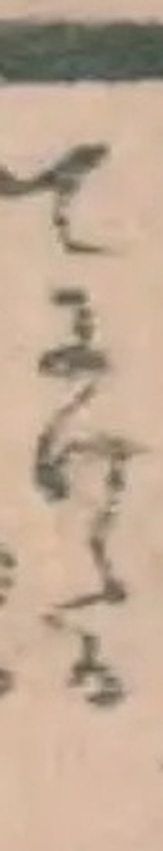てにけたる
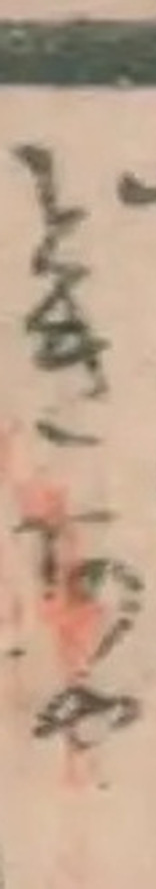ときあや
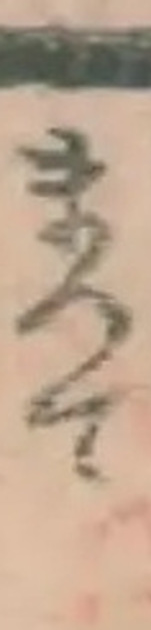まつて
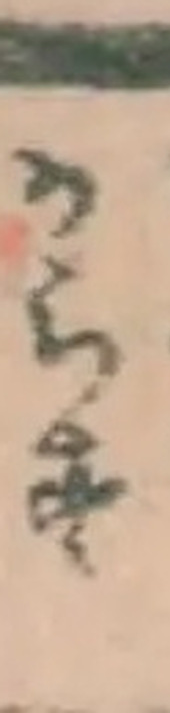からす
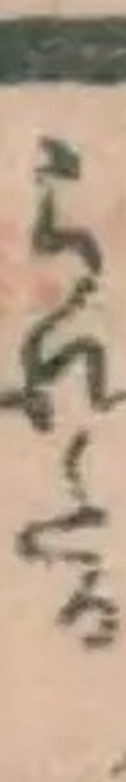られたる
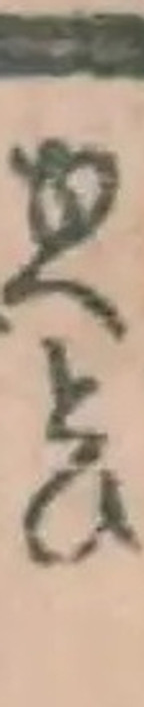ゆへとひ
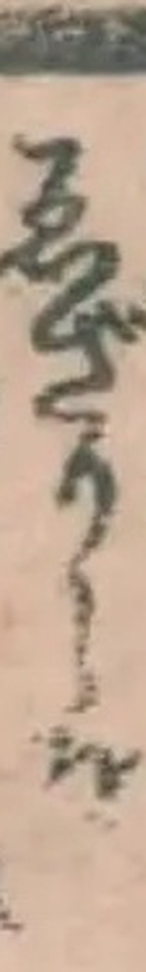ゑざりしを
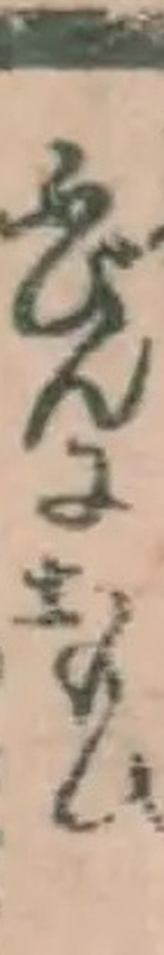ふびんにおもひ
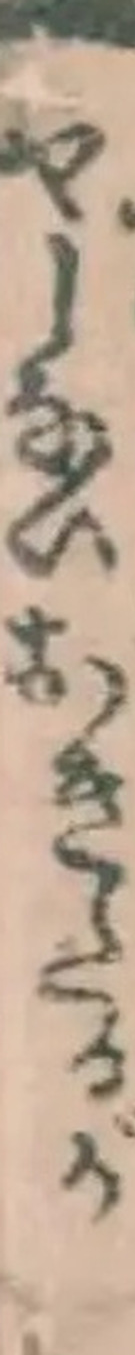やしないおきたるが
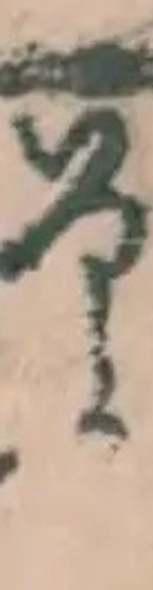いつしか
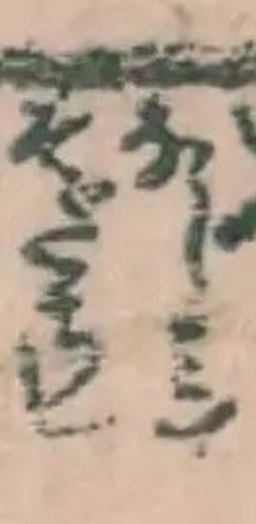そだちし
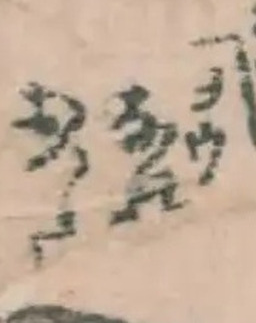おつた
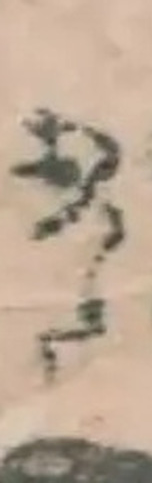おつた

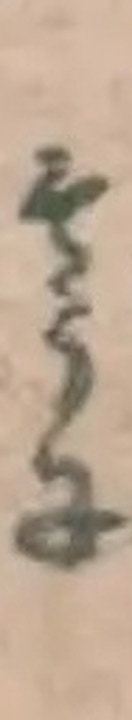そうに
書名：舌切雀
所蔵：国立国会図書館 National Diet Library, JAPAN
